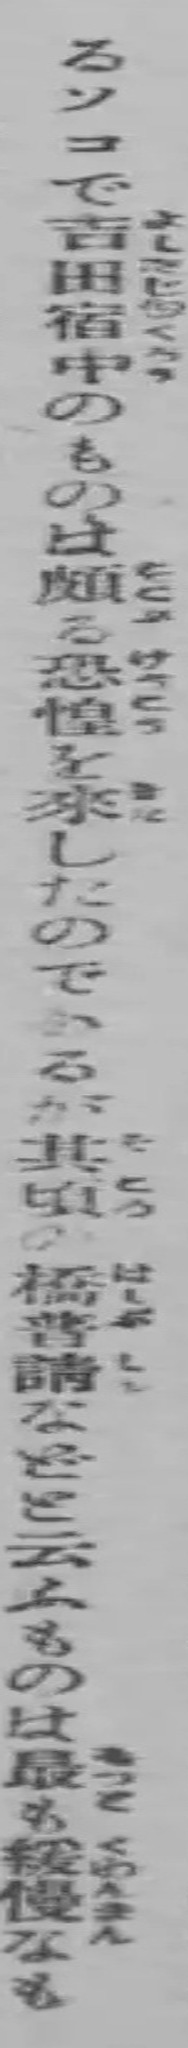るソコで吉田宿中のものは頗る恐惶を来したのであるが其頃の橋普請などと云ふものは最も緩慢なも
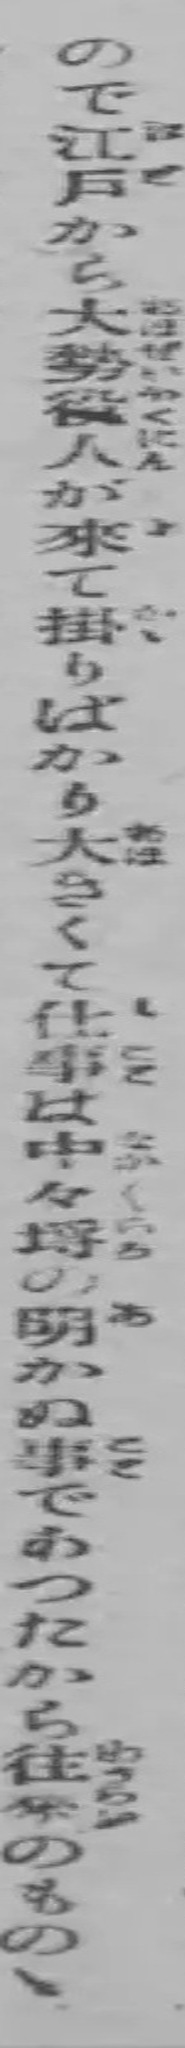ので江戸から大勢役人が来て掛りばかり大きくて仕事は中々埒の明かぬ事であつたから往来のものゝ
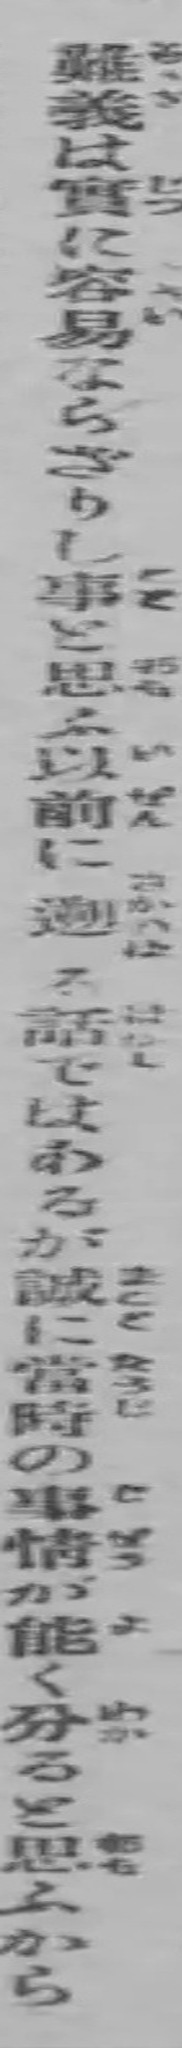難義は実に容易ならざりし事と思ふ以前に遡る話ではあるが誠に当時の事情が能く分ると思ふから
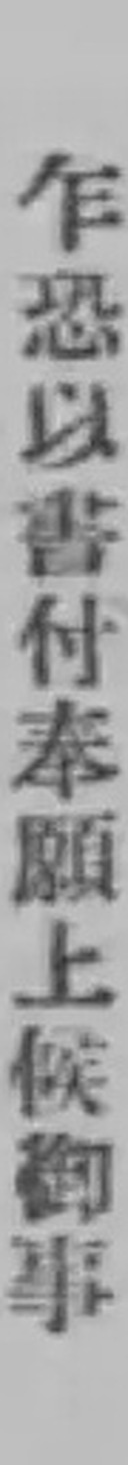乍恐以書付奉願上候御事
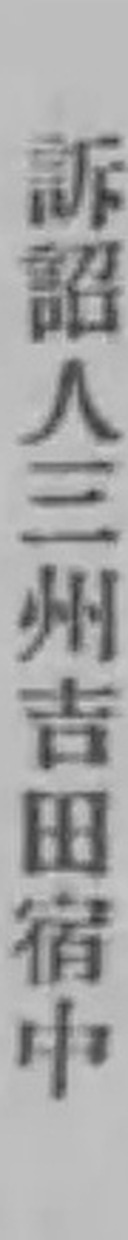訴詔人三州吉田宿中
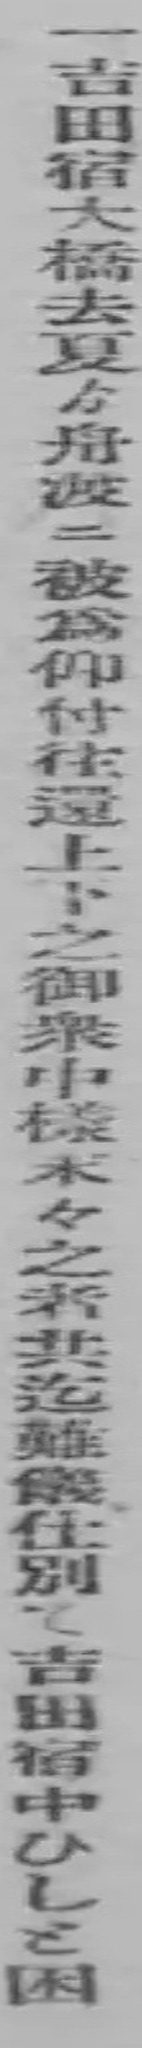一吉田宿大橋去夏ゟ舟渡ニ被為仰付往還上下之御衆中様末々之者共迄難儀仕別て吉田宿中ひしと困
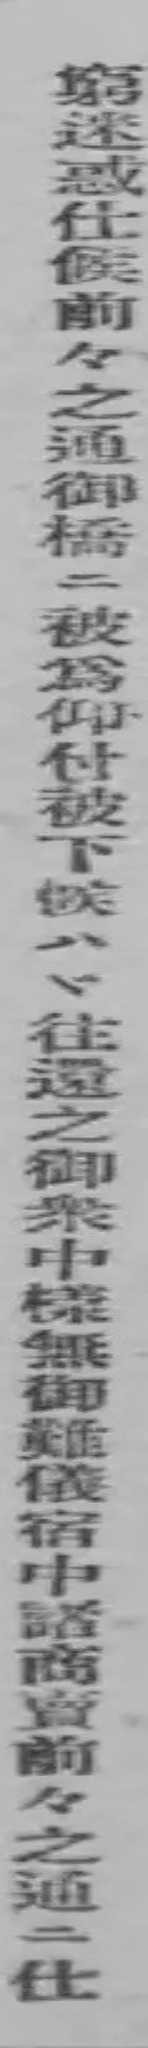窮迷惑仕候前々之通御橋ニ被為仰付被下候ハヾ往還之御衆中様無難儀宿中諸商売前々之通ニ仕
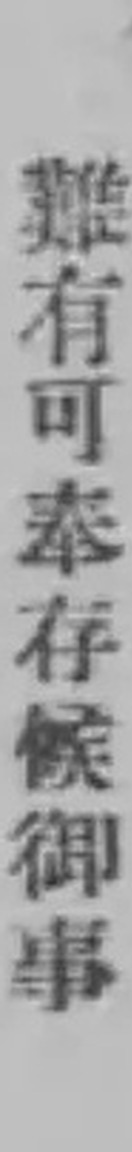難有可奉存候御事
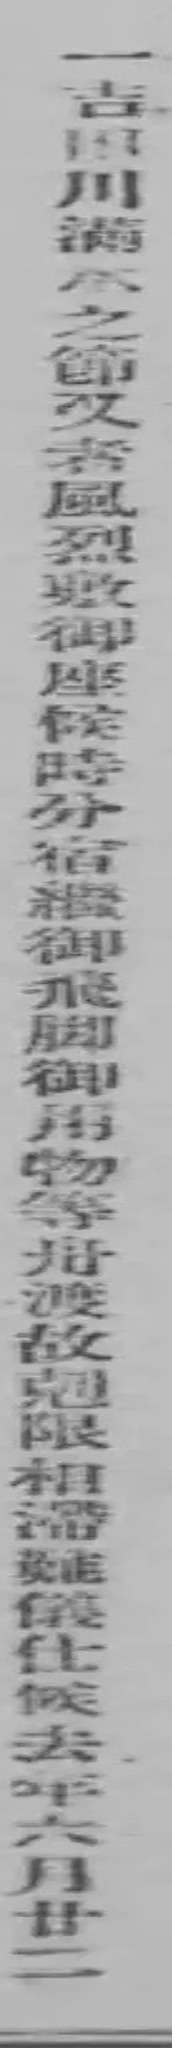一吉田川満水之節又者風烈敷御座候時分宿継御飛脚御用物等舟渡故剋限相滞難儀仕候去年六月廿二
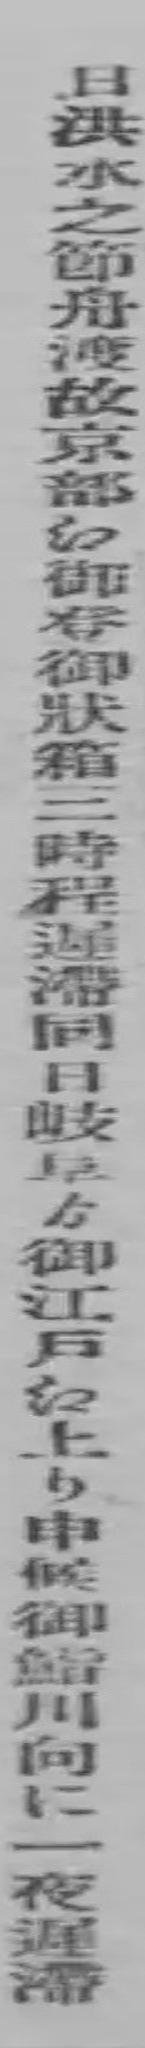日洪水之節舟渡故京部江御登御状箱三時程遅滞同日岐阜ゟ御江戸江上り申候御鮨川向に一夜遅滞
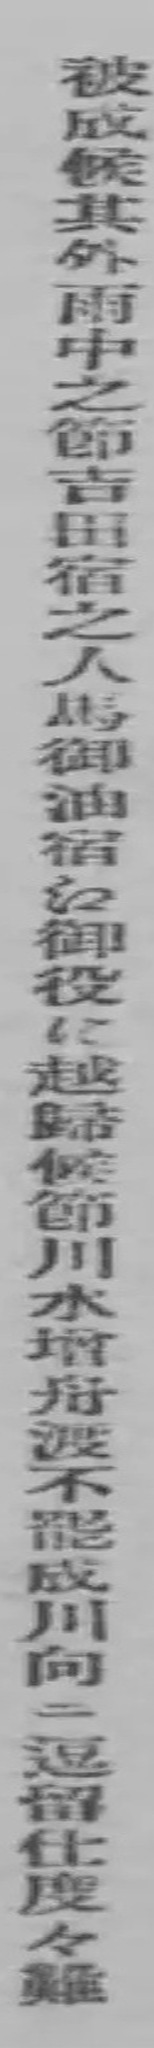被成候其外雨中之節吉田宿之人馬御油宿江御役に越帰候節川水増舟渡不罷成川向ニ逗留仕度々難
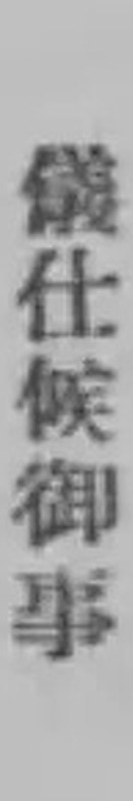儀仕候御事
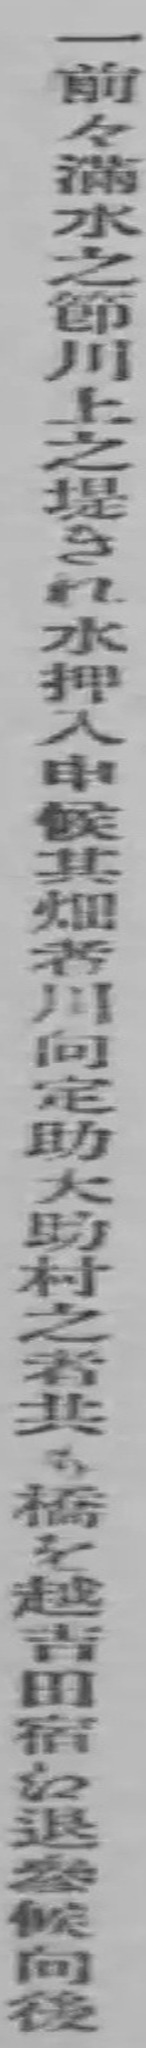一前々満水之節川上之堤きれ水押入申候其畑者川向定助大助村之者共も橋を越吉田宿江退参候向後
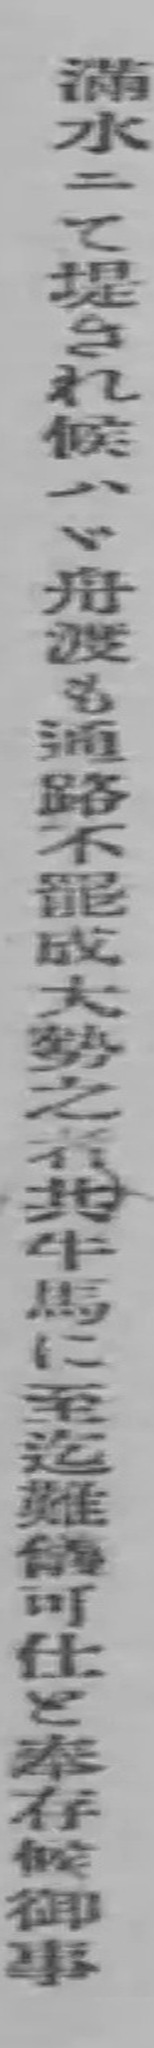満水ニて堤きれ候ハヾ舟渡も通路不罷成大勢之者共牛馬に至迄難儀可仕と奉存候御事

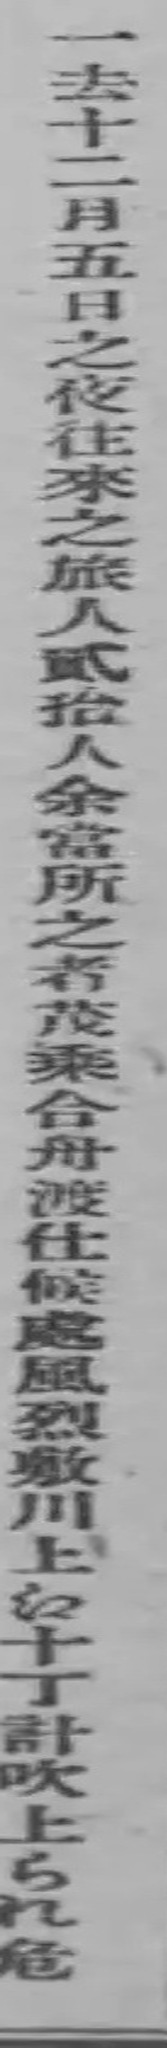一去十二月五日之夜往来之旅人弐拾人余当所之者茂乗合舟渡仕候処風烈敷川上え十丁計吹上られ危
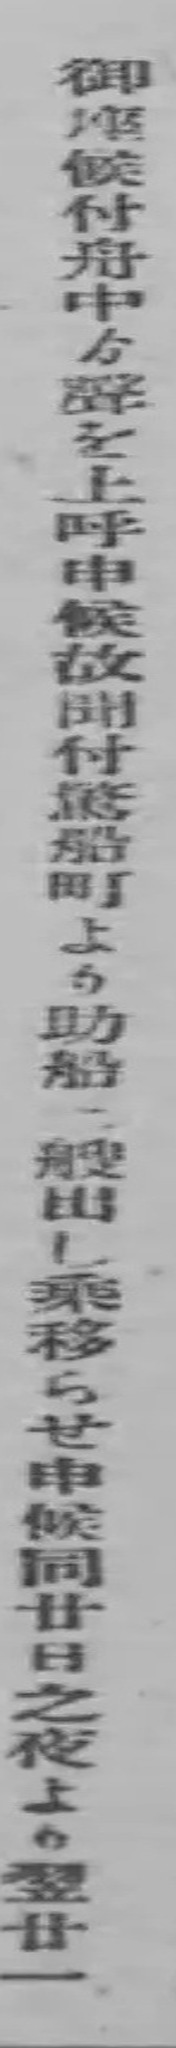御座候付舟中ゟ声を上呼申候故聞付驚船町より助船二艘出し乗移らせ申候同廿日之夜より翌廿一
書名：豊橋市史談
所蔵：国立国会図書館 National Diet Library, JAPAN
